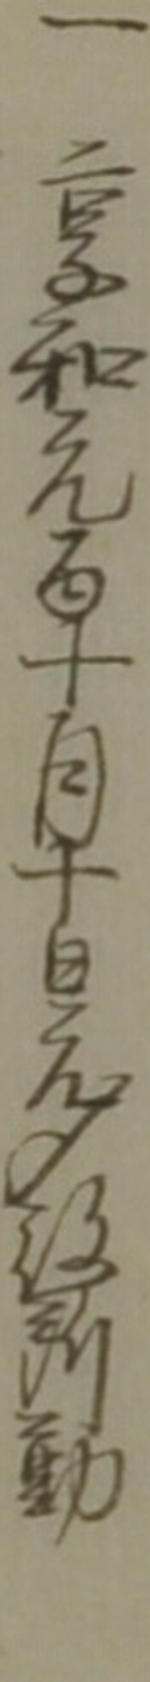一享和元酉十月十日元〆役所勤
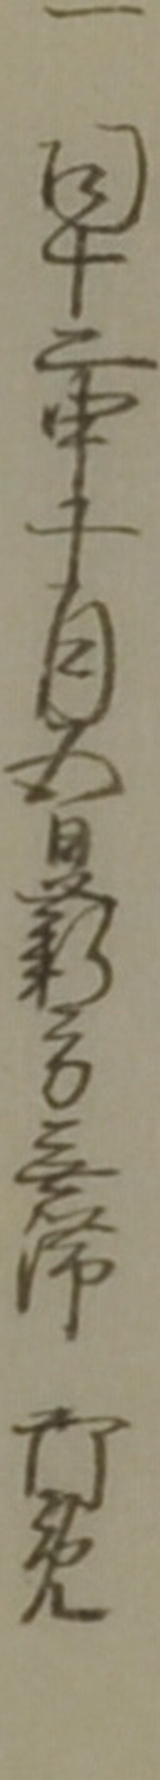一同十二申十月五日薪方無滞御免
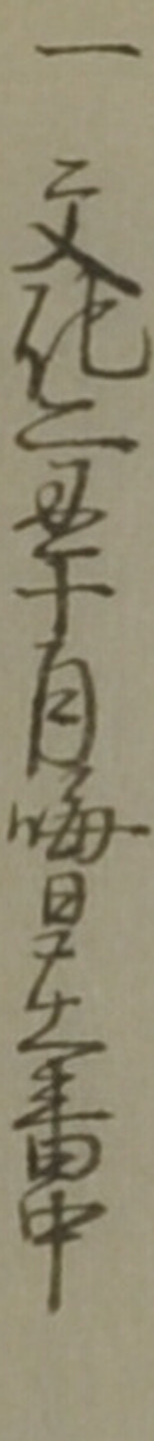一文化二丑十月晦日在番中
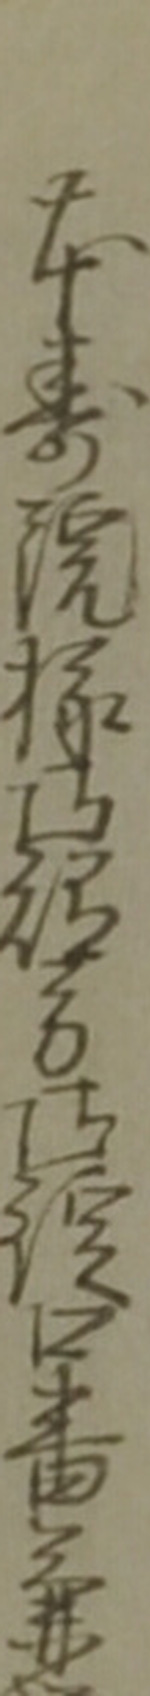本寿院様御賄方御錠口番兼帯
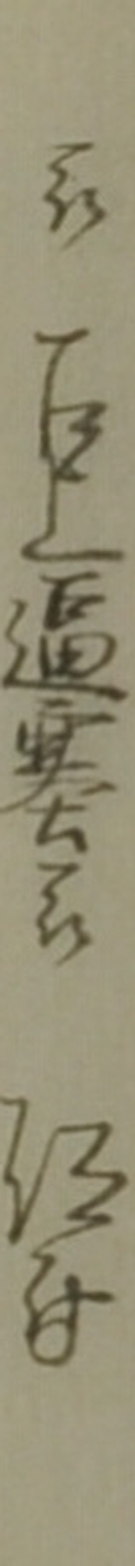被召上逼塞被仰付
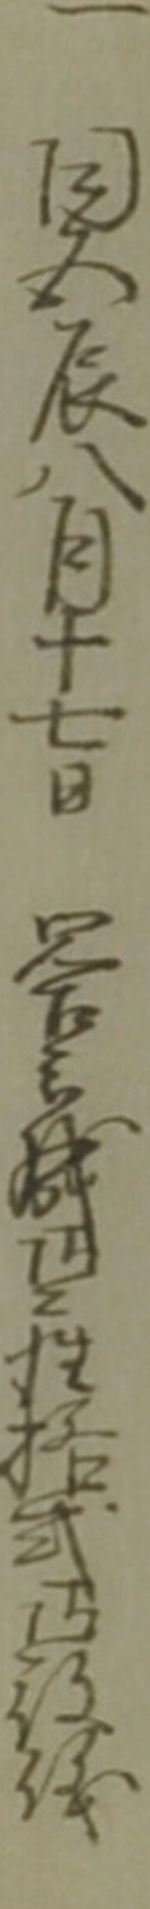一同五辰八月十七日思召被成御座格式御役議儀
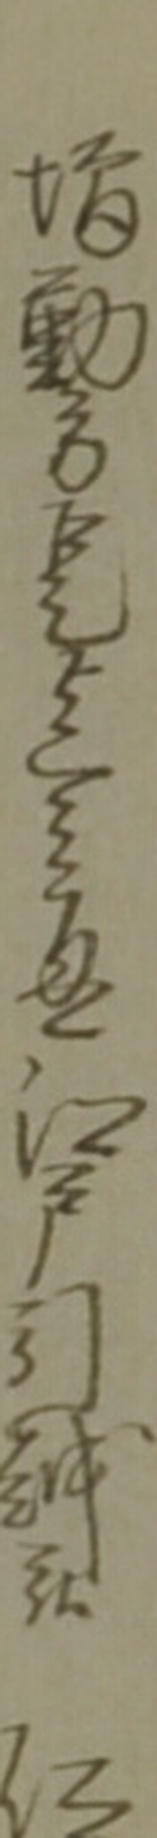増勤方是迄之通江戸引越被仰付
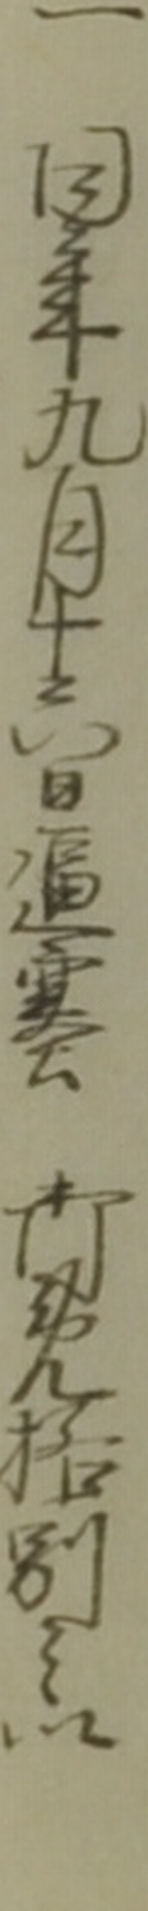一同年九月十六日逼塞御免格別之以
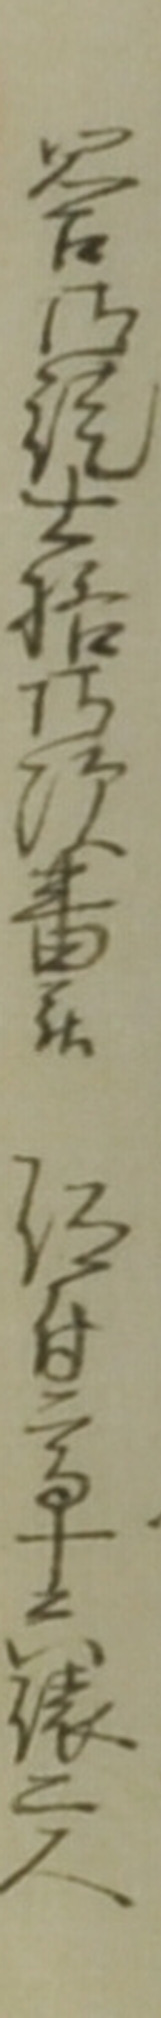思召御徒士格御次番被仰付高十六俵二人

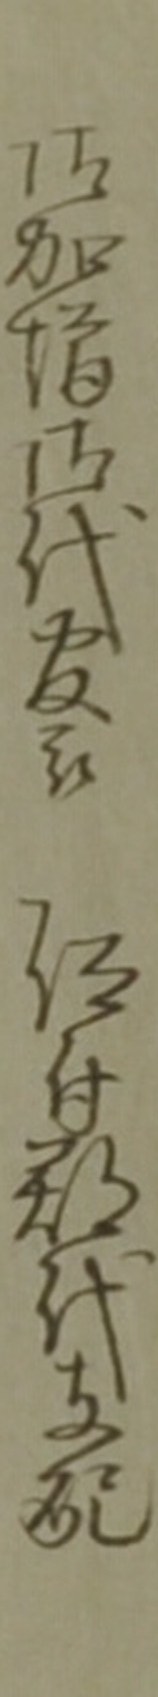御加増御代官被仰付郡代支配

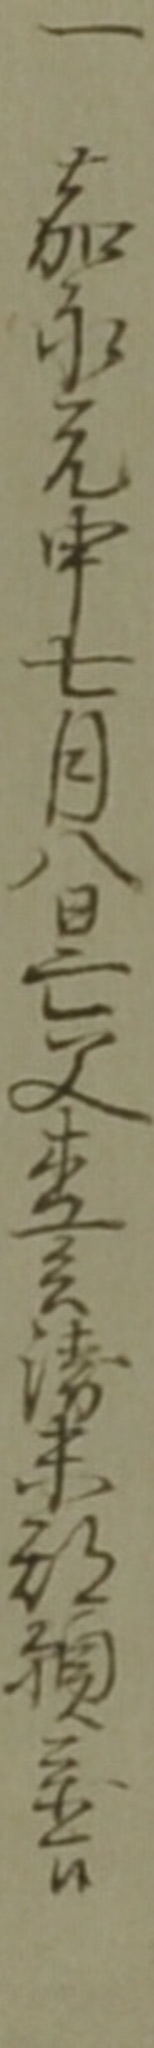一嘉永元申七月八日亡父杢兵衛末期願置候
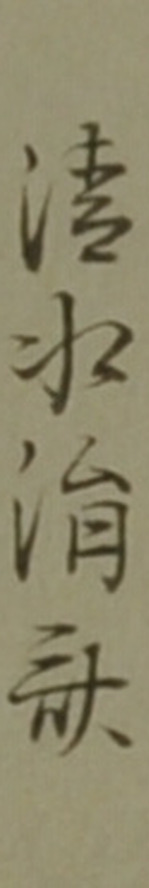清水渭斎
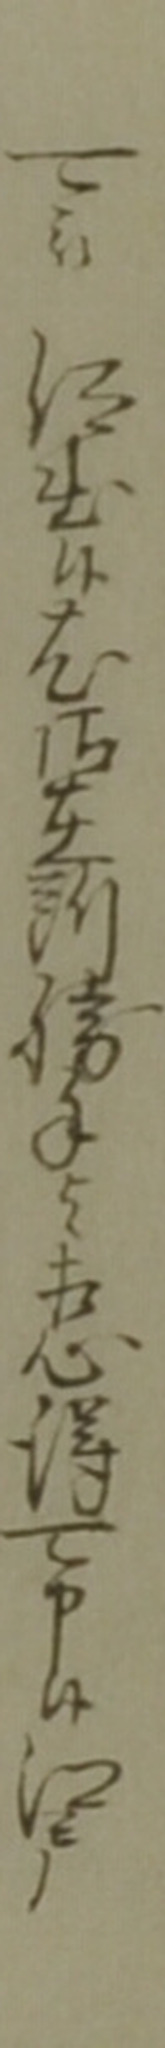可被仰出尤御在所勝手与相心得可申候江戸
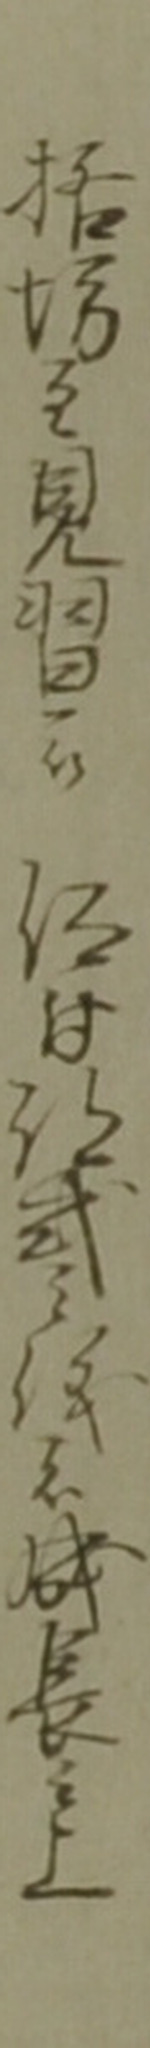格坊主見習被仰付跡式之儀者成長之上
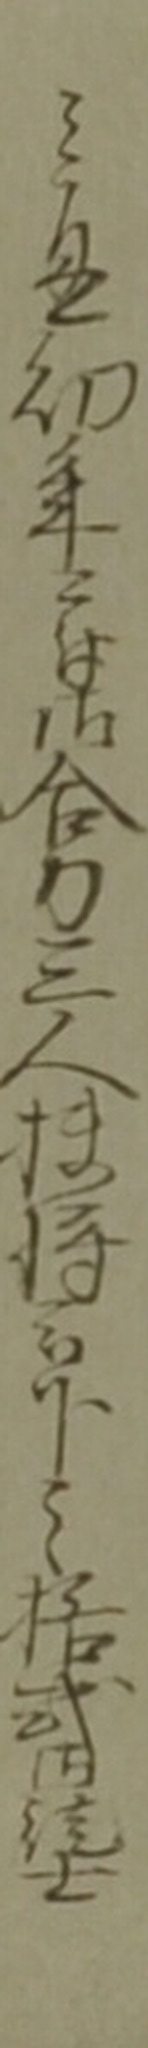之通幼年ニ付御合力三人扶持被下之格式御徒士
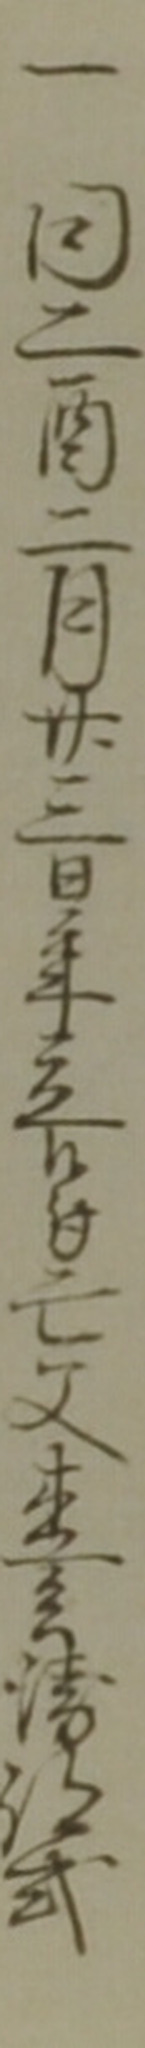一同二酉に月廿三日年立候付亡父杢兵衛跡式
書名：無足諸士勤仕録（七）
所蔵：伊那市立高遠町図書館・合同会社AMANE
